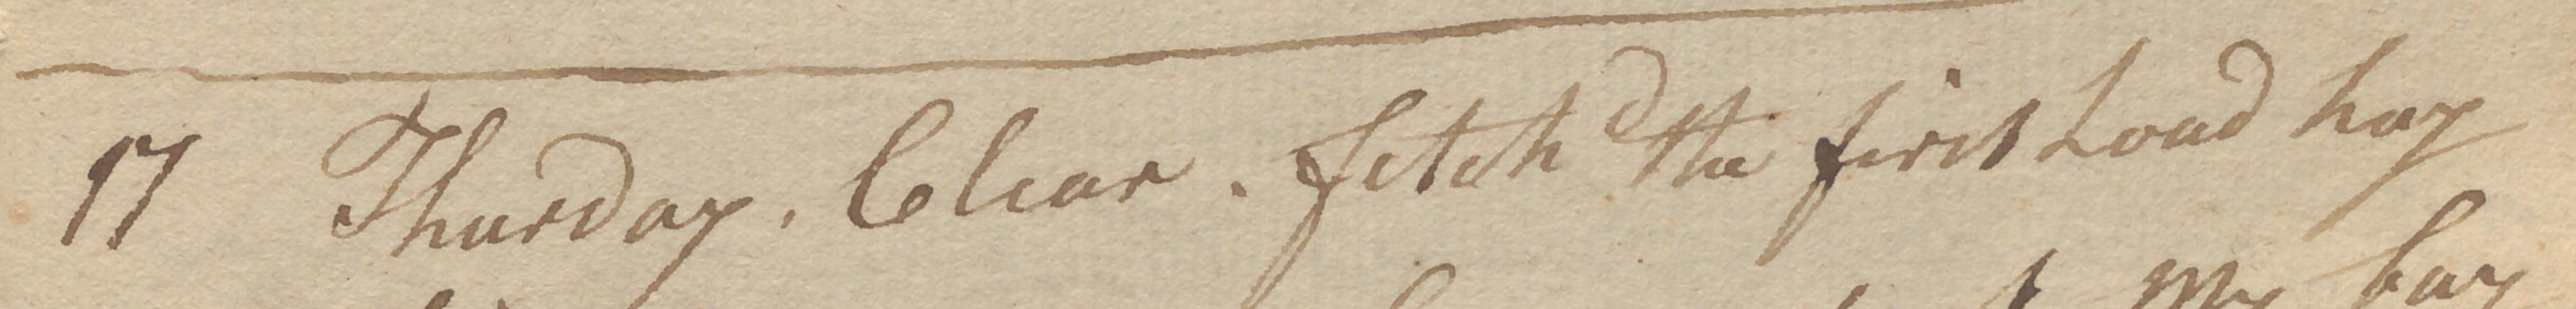17 Thurday. Clear. fetch^d the first Load hay
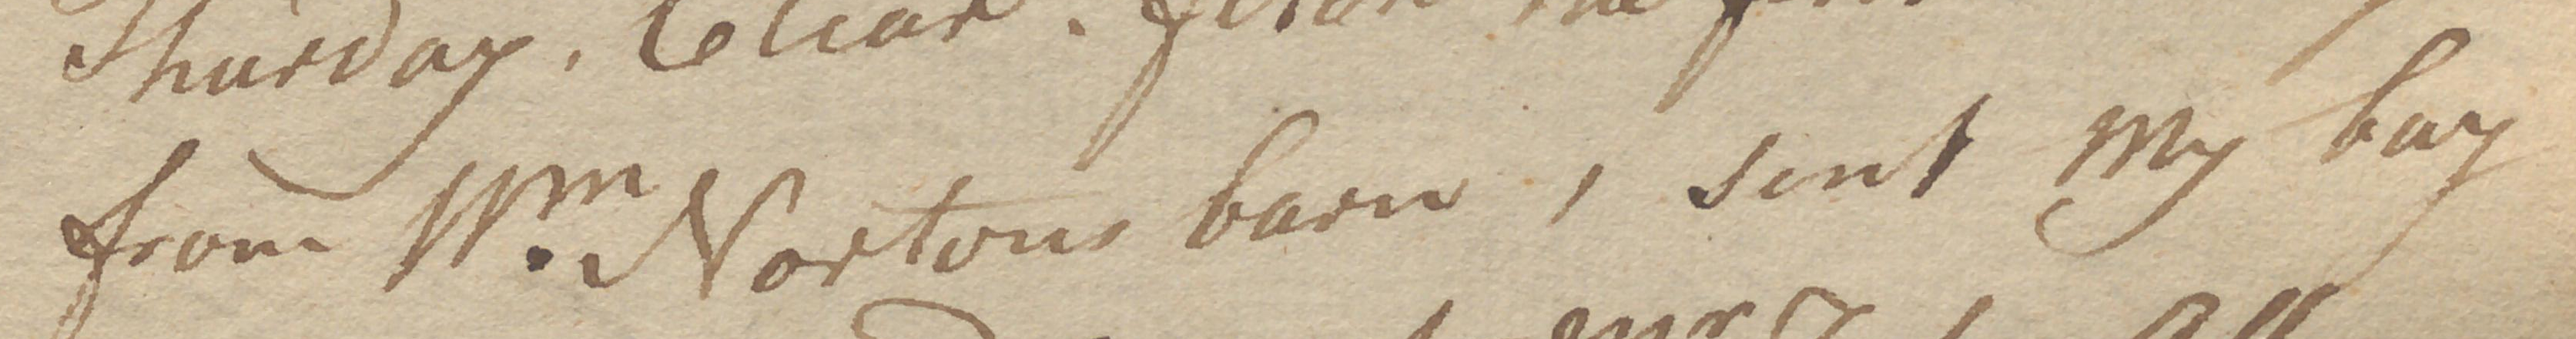from W^m. Nortons barn, sent My bay
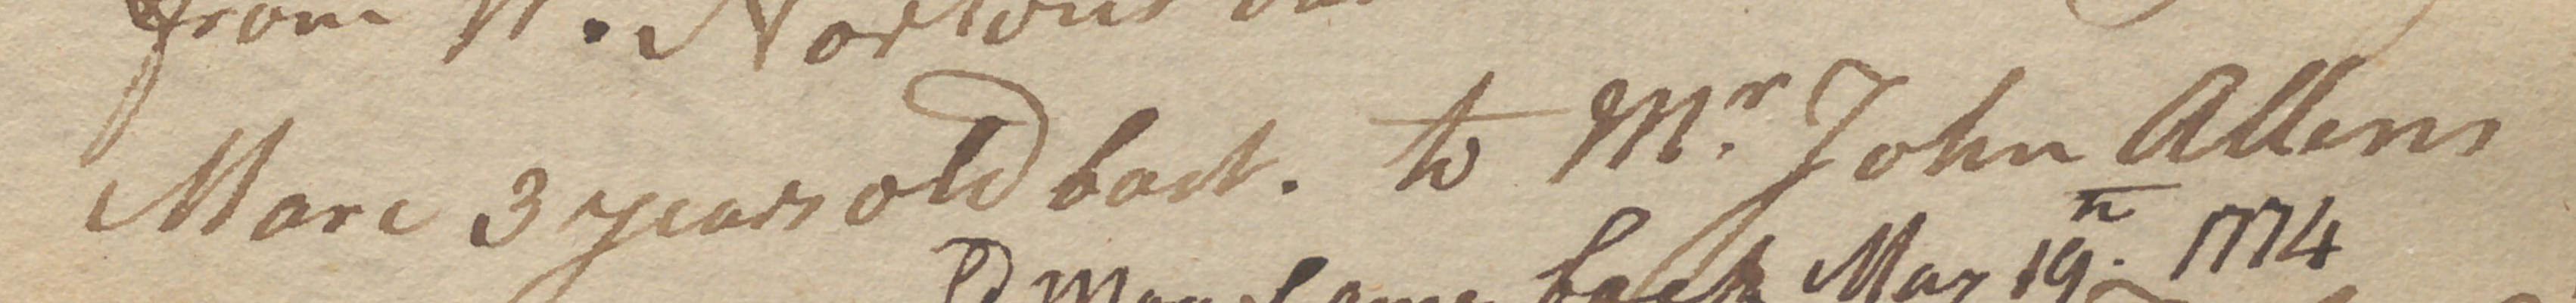Mare 3 years old back to M^r. John Allens
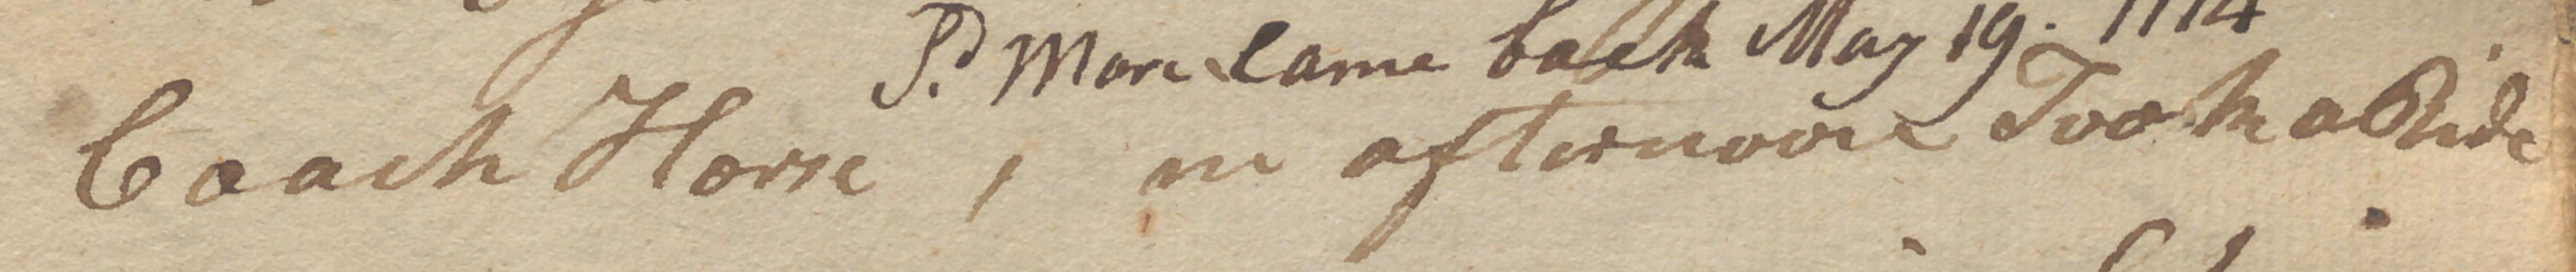Coach Horse, in afternoon Took a Ride
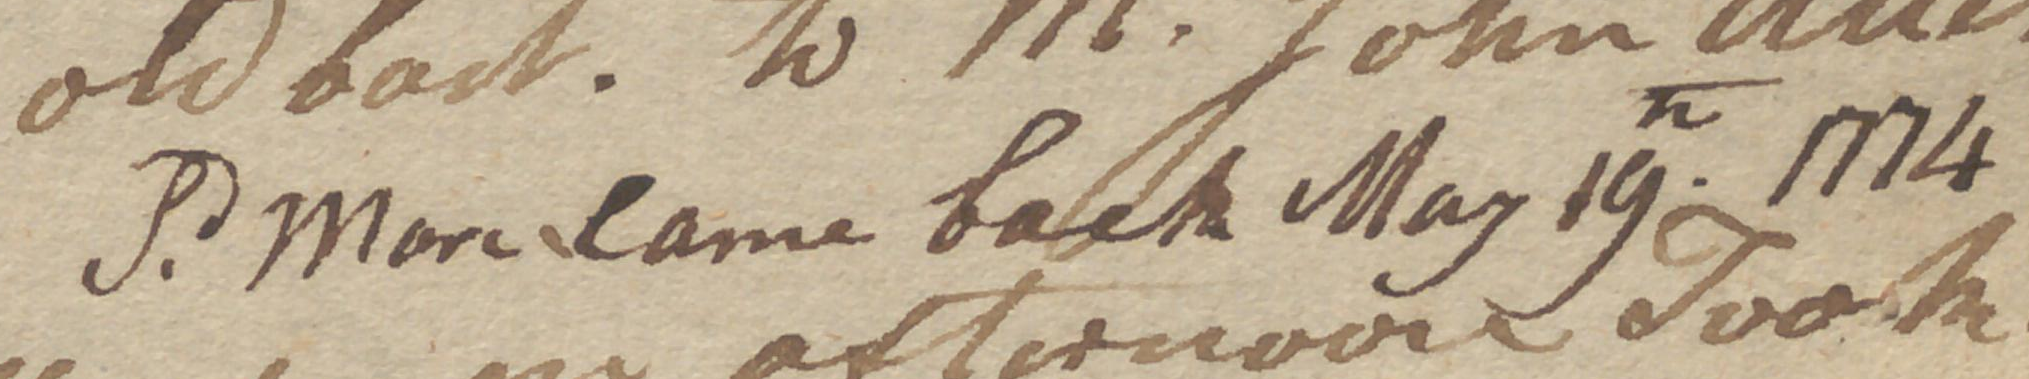s^d. Mare came back May 19^th. 1774
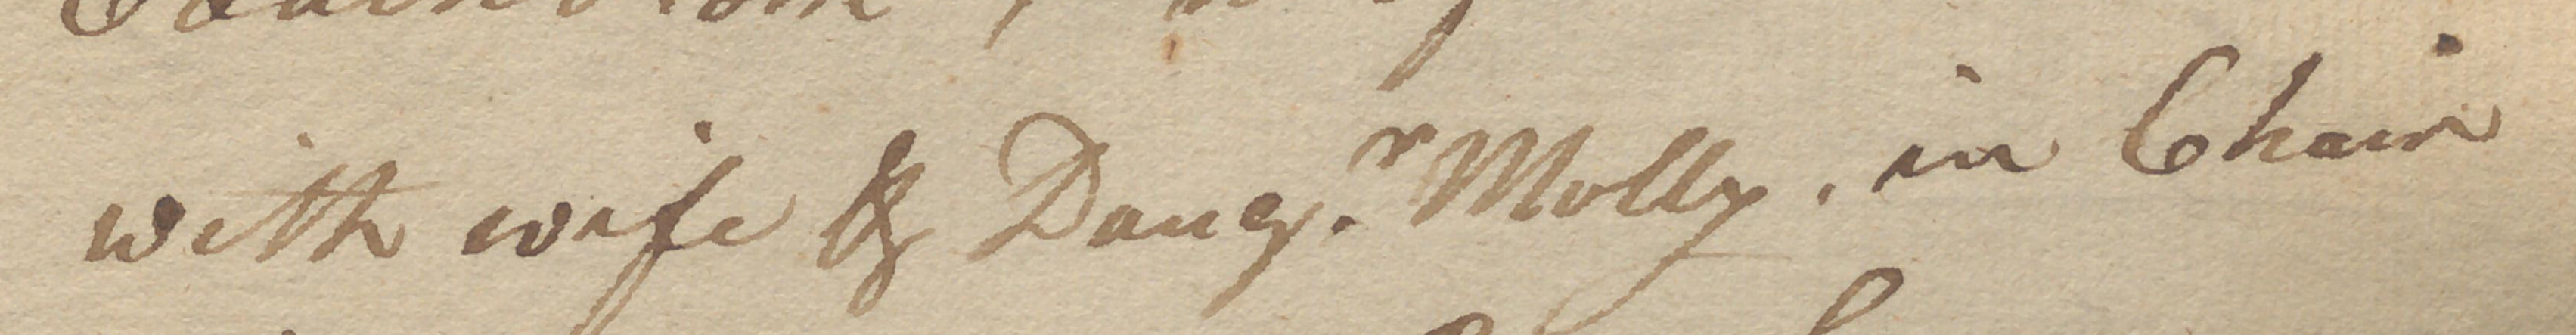with wife & Daug^r. Molly, in Chair
